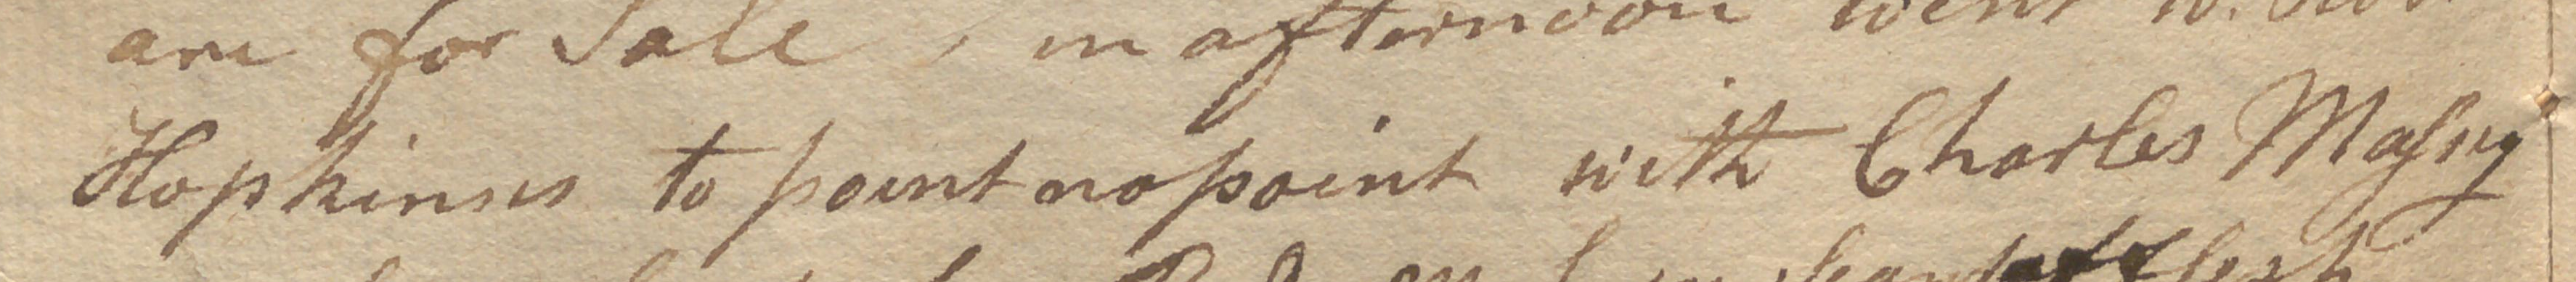Hopkinses to point nopoint with Charles Massey
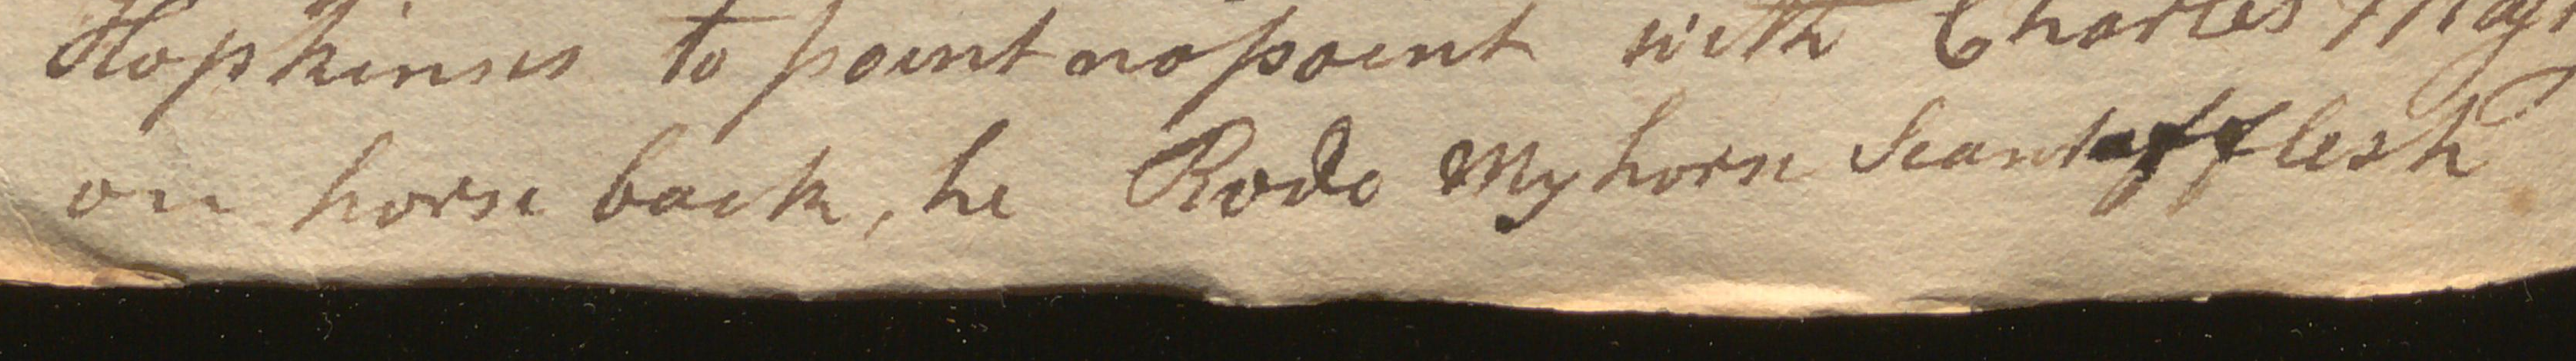on horse back, he Rode My horse Seastaflesh
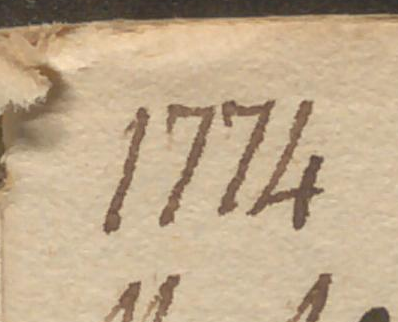1774
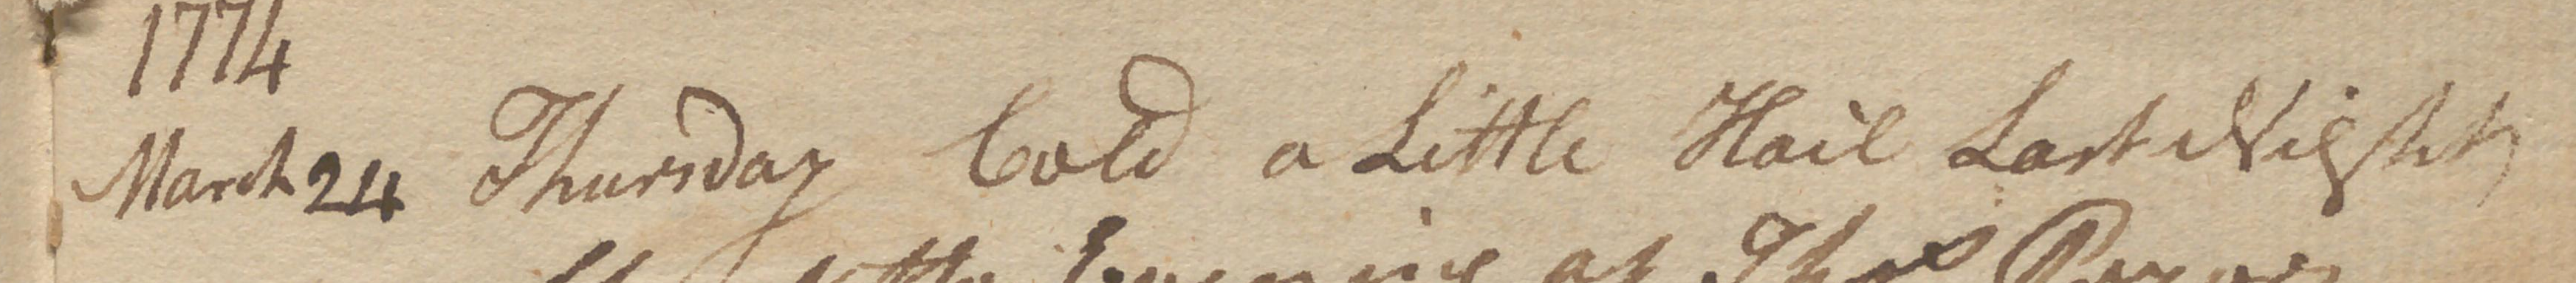March 24 Thursday Cold a Little Hail Last Night
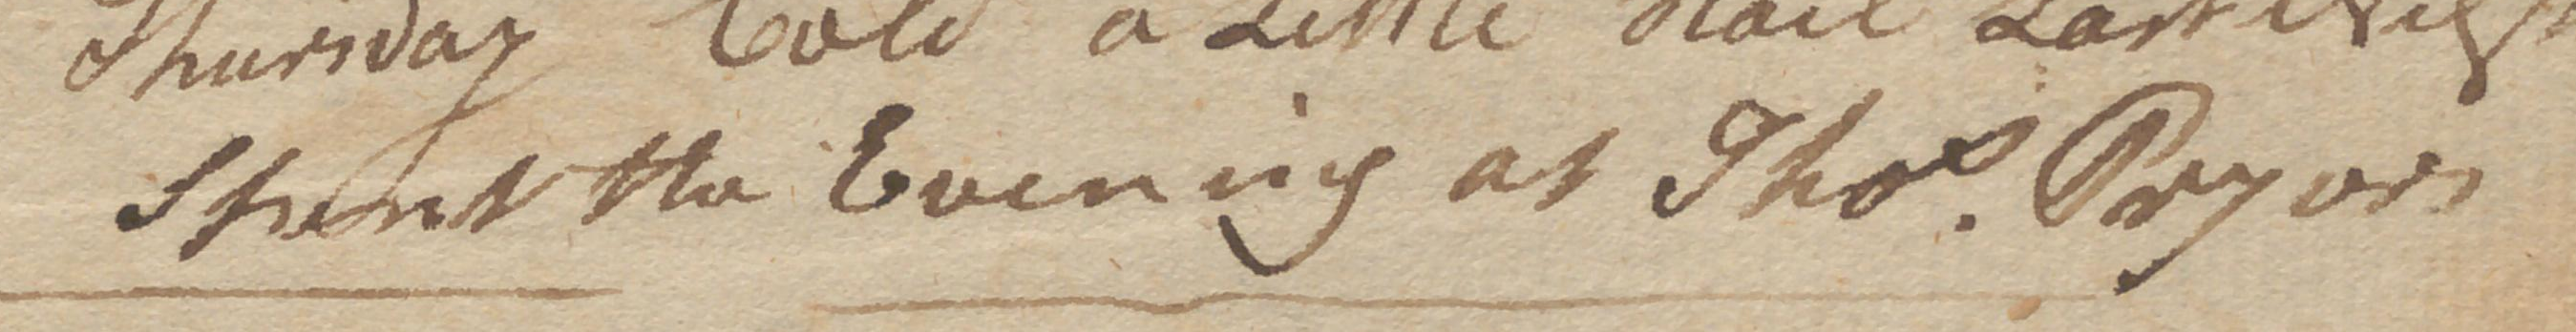spent the Evening at Tho^s. Pryors
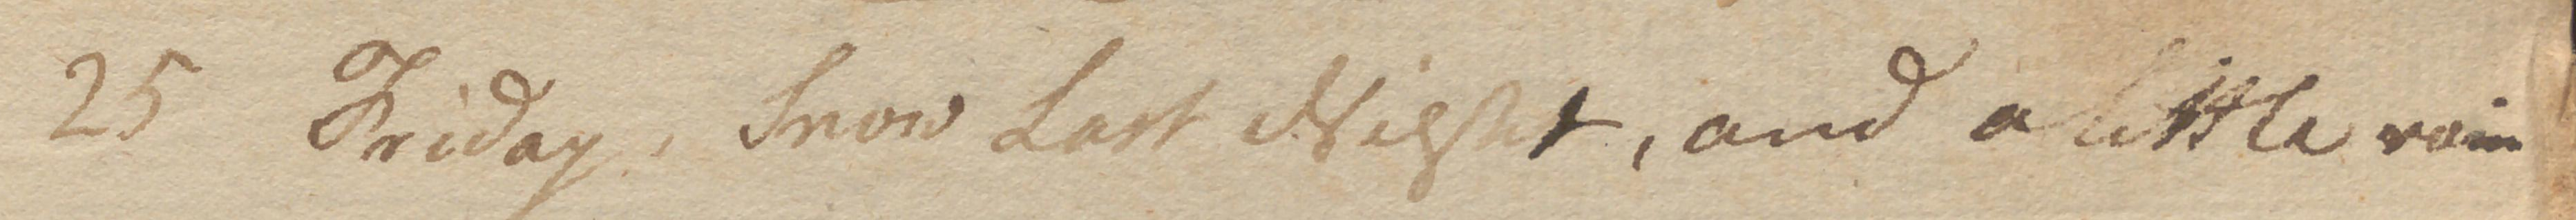25 Friday, Snow Last Nigt, and a little rain
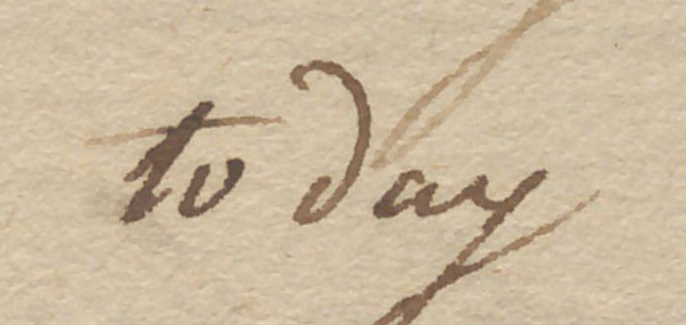to day
